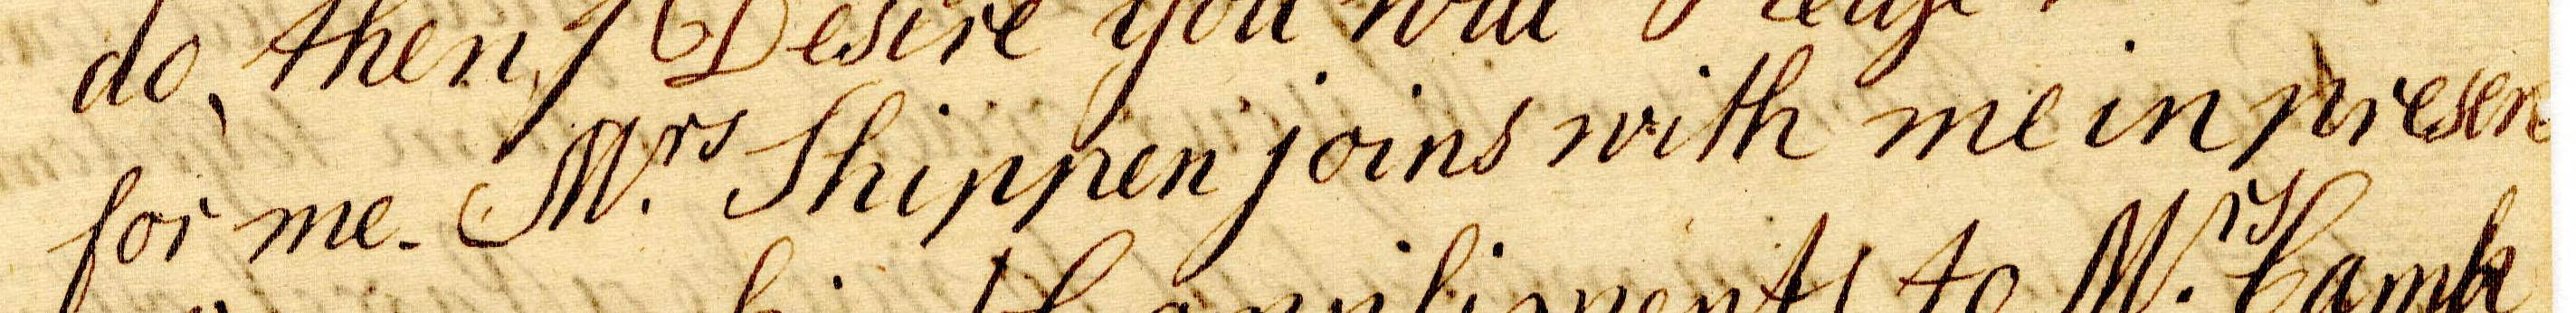for me. M^rs. Shippen joins with me in present
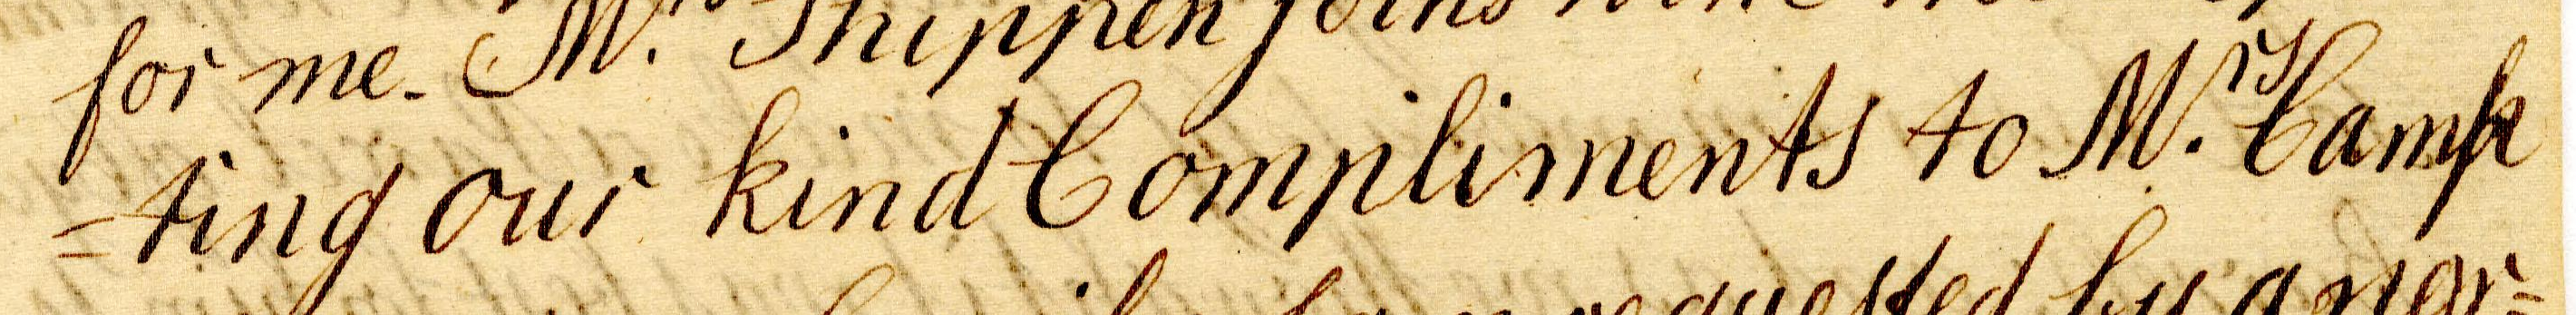-ting our kind Compliments to M^r. Camp
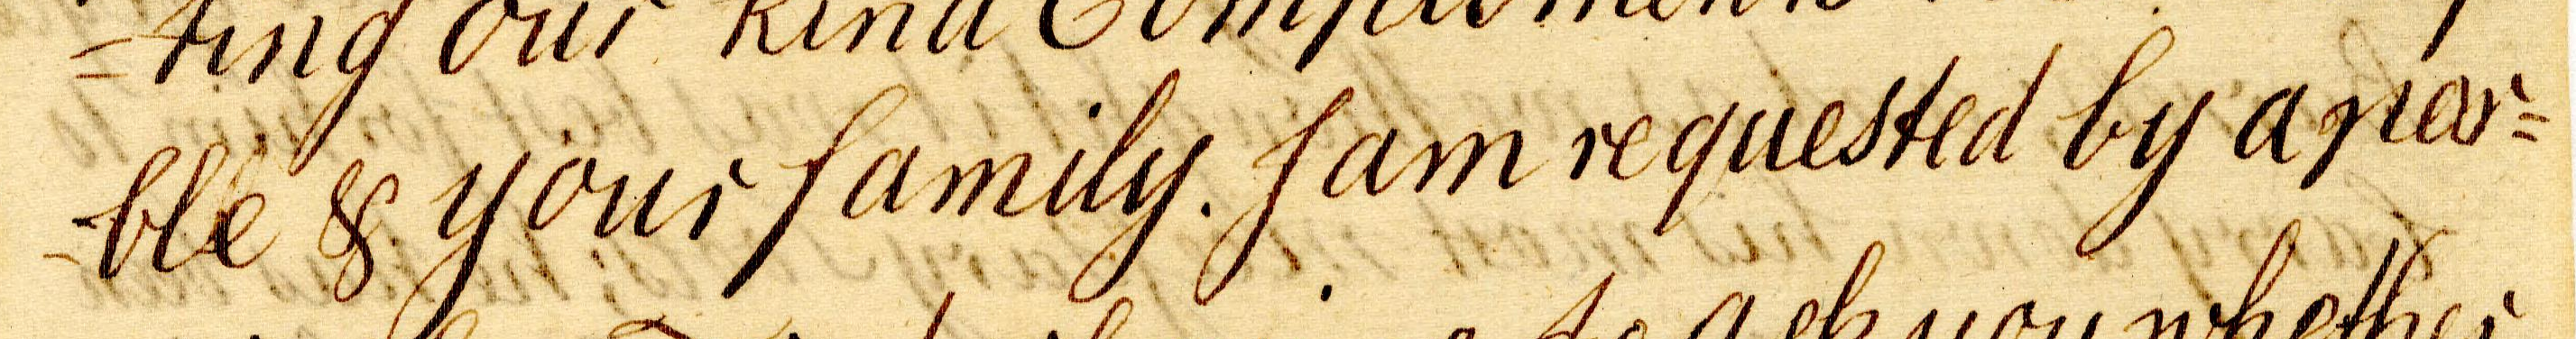-ble & your family. I am requested by a par-
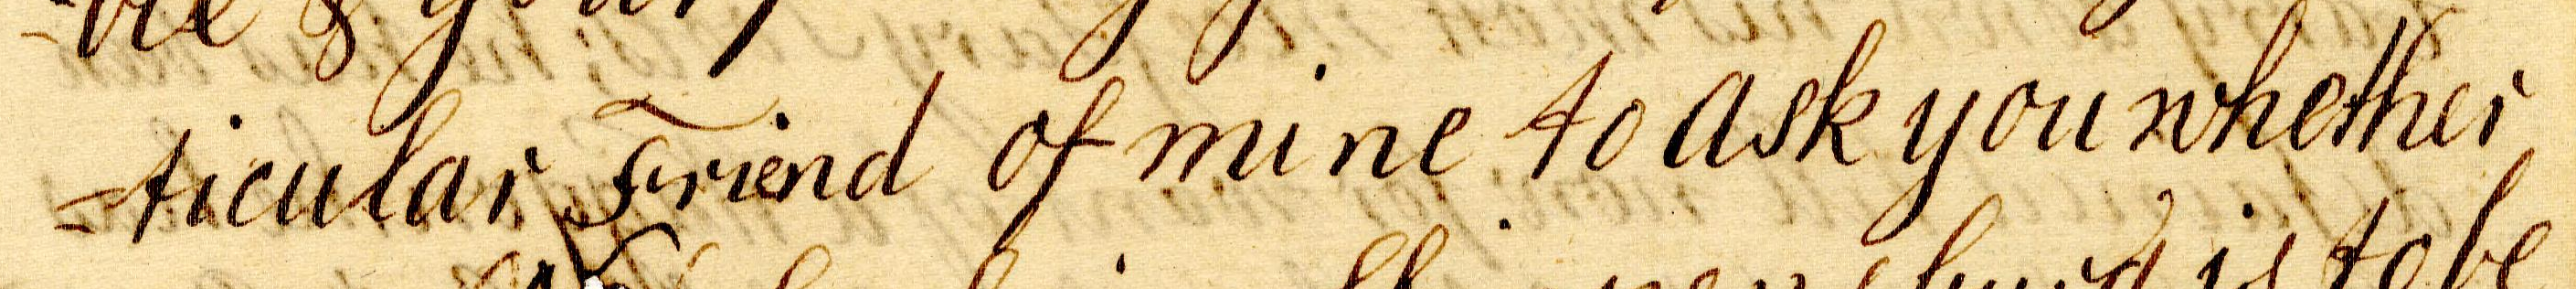-ticular friend of mine to Ask you whether
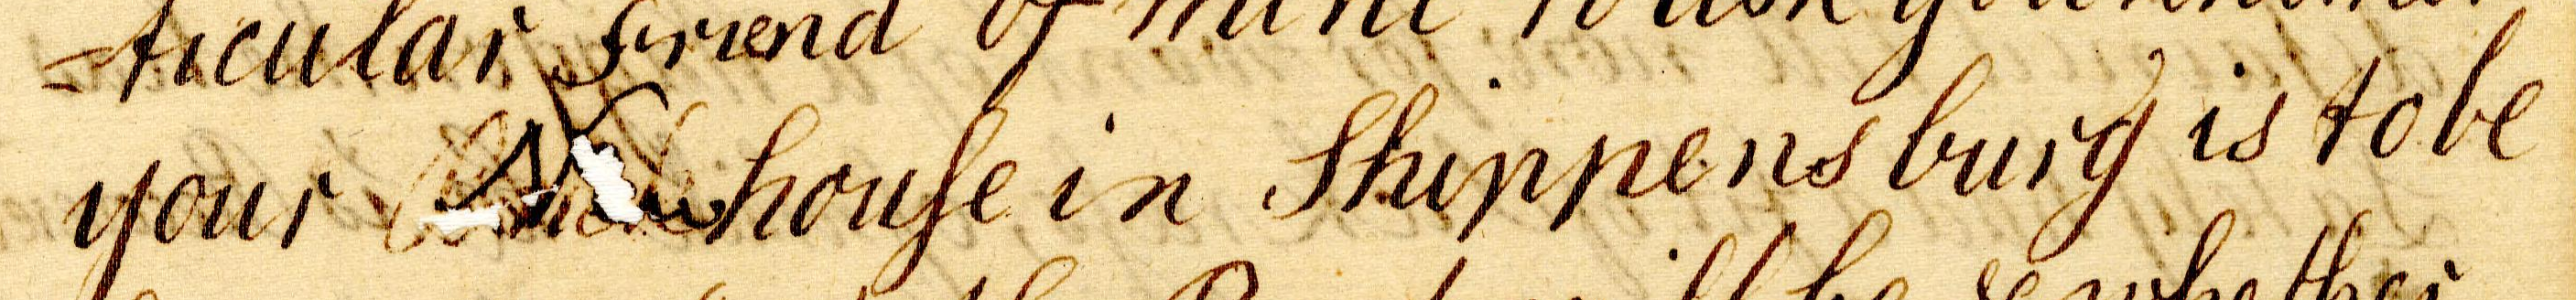your [____] house in Shippensburg is to be
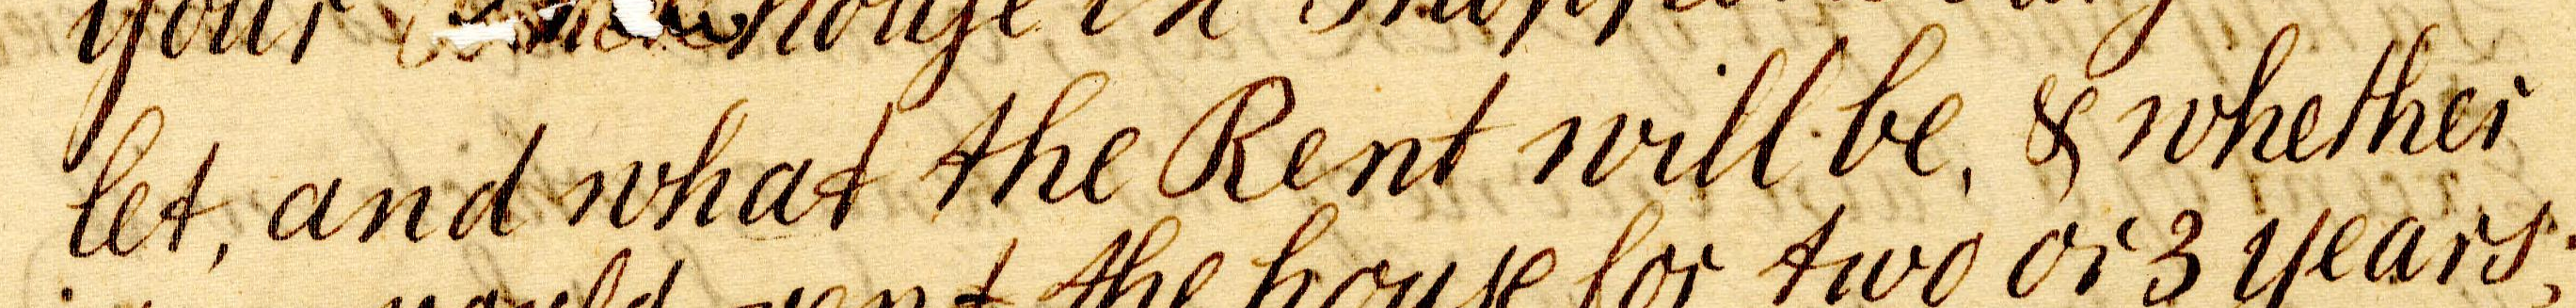let, and what the Rent will be, & whether
